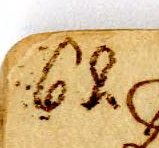62
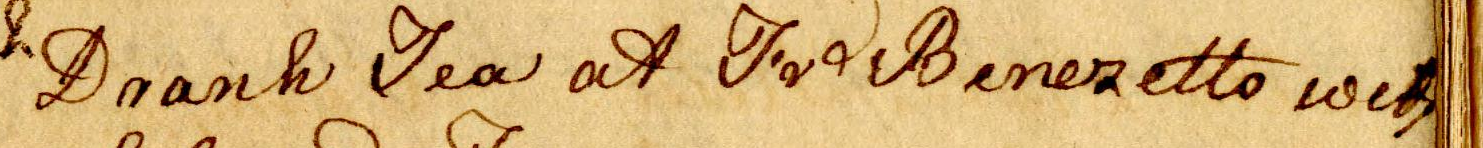Drank Tea at Fr^d Benezetts wit
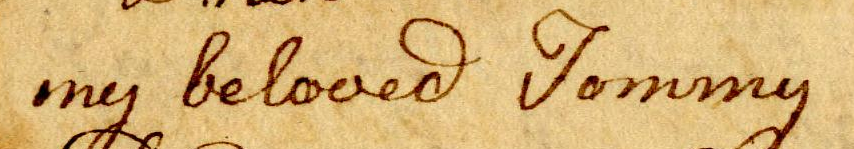my beloved Tommy
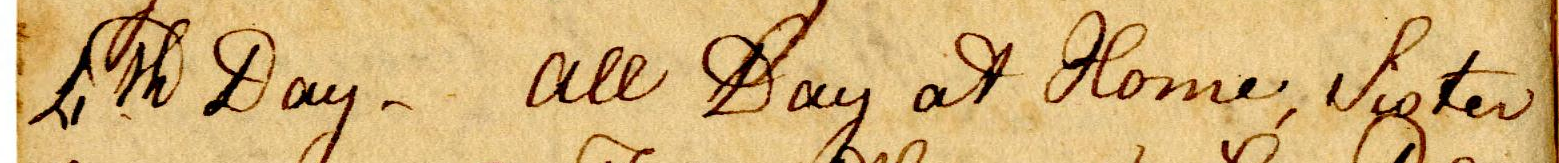4^th Day- All Day at Home, Sister
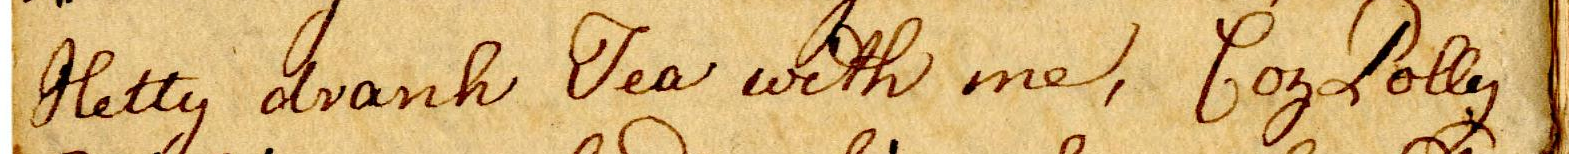Hetty drank Tea with me, Coz Polly
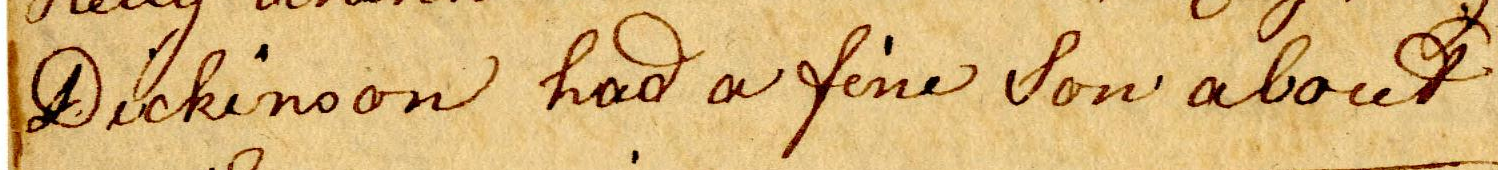Dickinson had a fine Son about
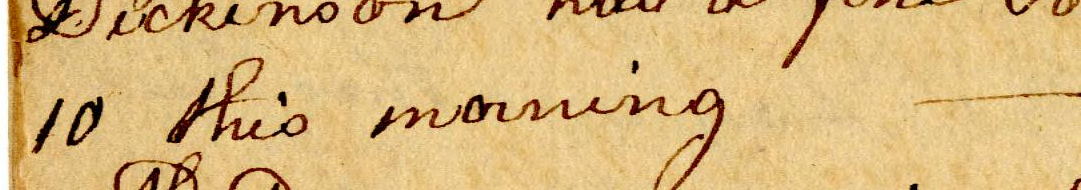10 this morning-
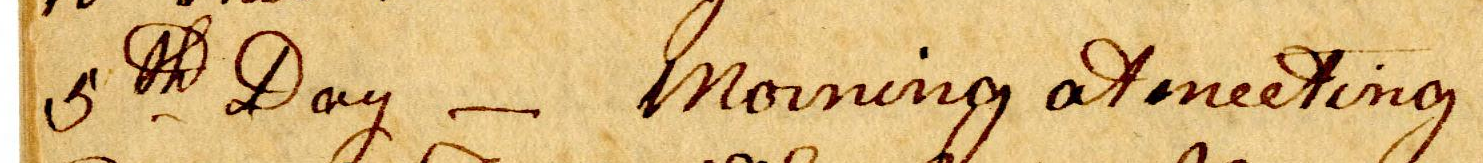5^th Day- Morning at meeting
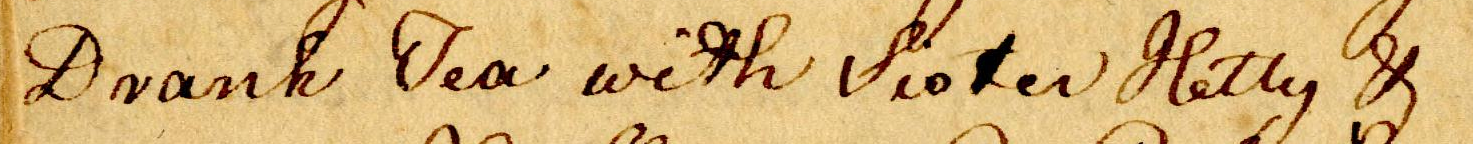Drank Tea with Sister Hetty &
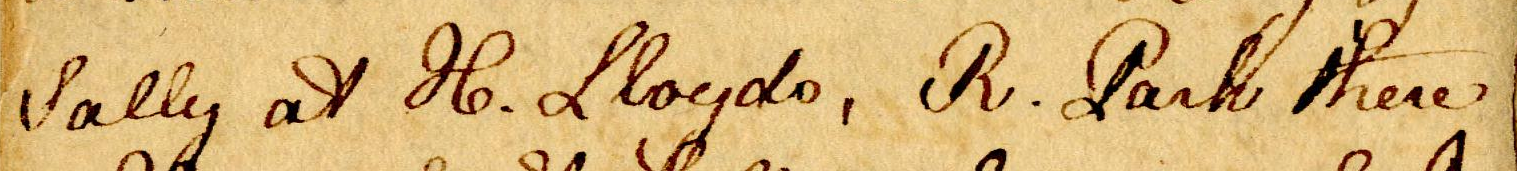Sally at H. Lloyds, R. Park there
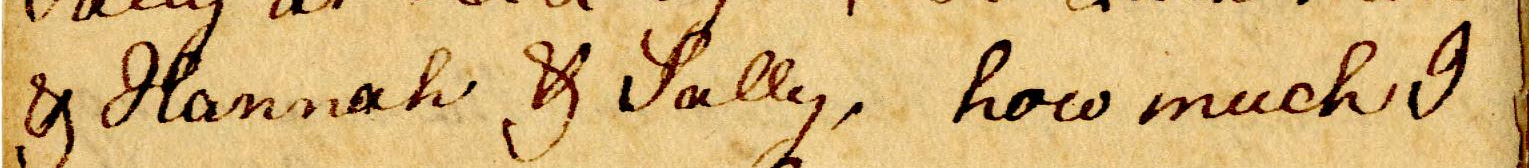& Hannah & Sally, how much I
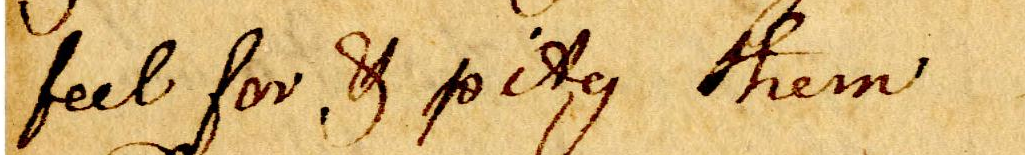feel for & pity them
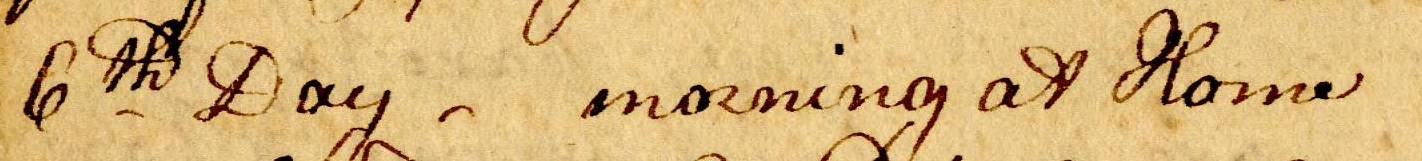6^th Day- morning at Home
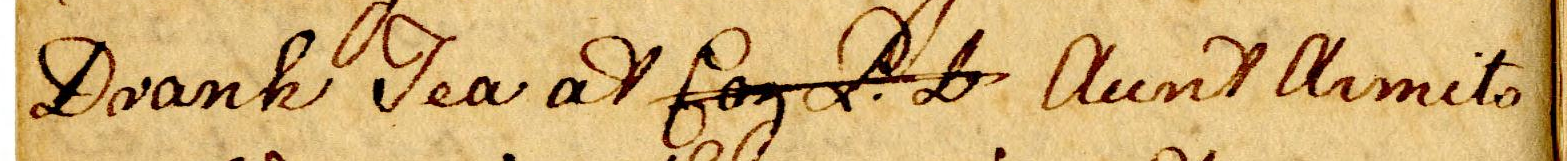Drank Tea at Coz P. L Aunt Armits
